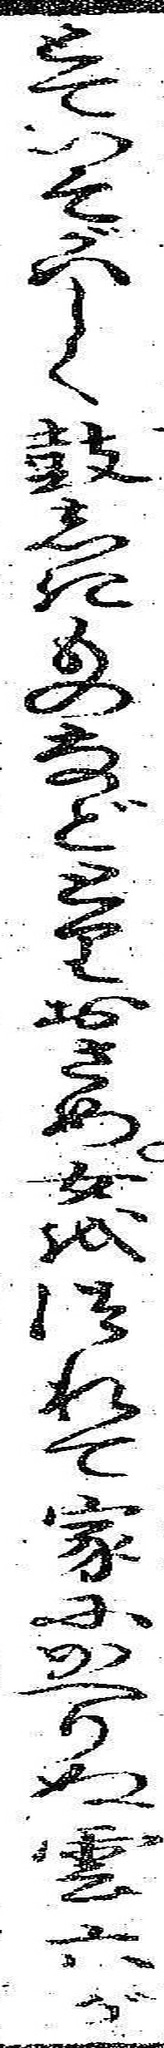とていそがはしく鼓しきものなどとりおさめ。女をつれて家にかへりぬ。雲六が
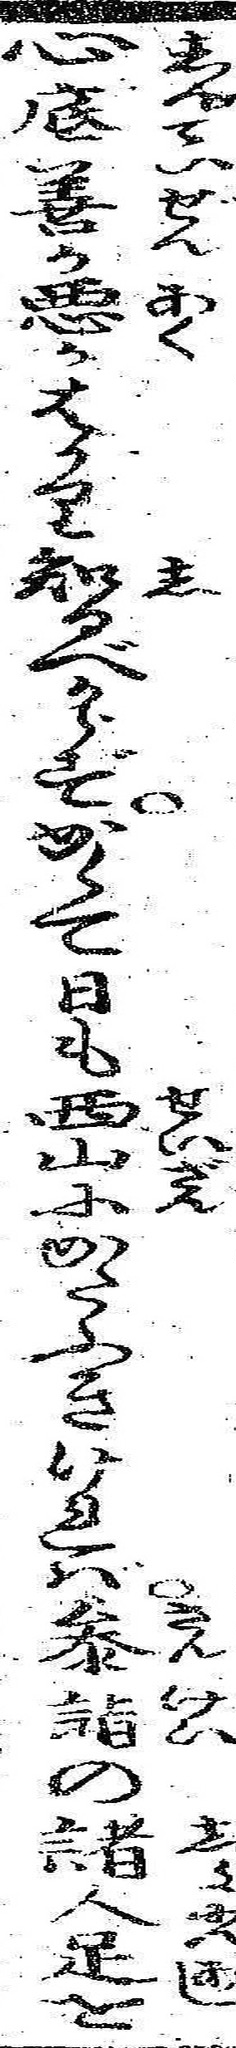心底善か悪かはかり知るべからず。かくて日も西山にかたふきければ。参詣の諸人足を
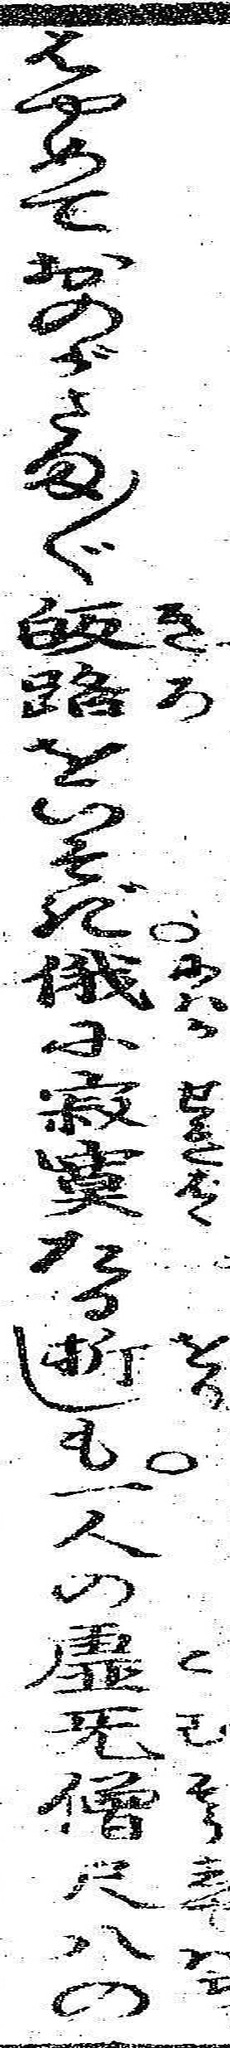はやめておのがさま〴〵帰路をいそぎ。俄に寂寞たる折しも。一人の虚無僧尺八の
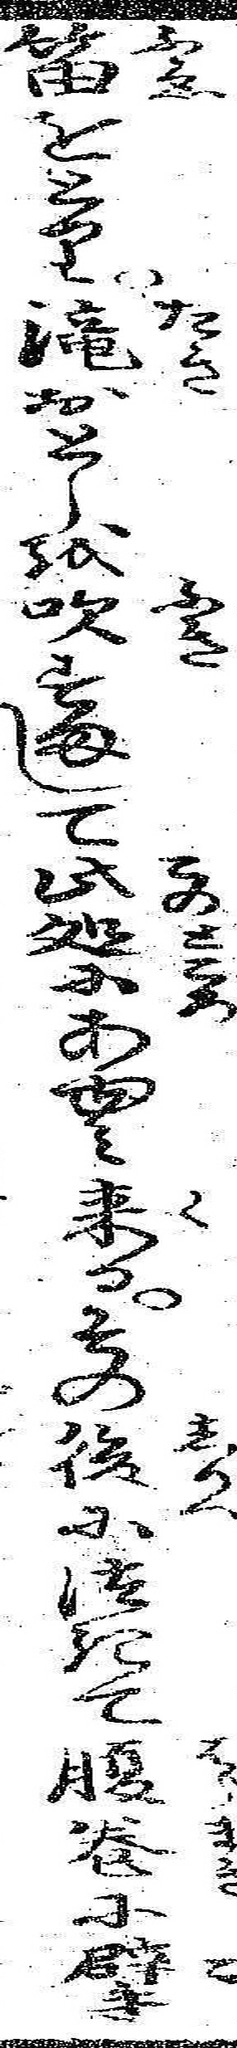笛をとり。滝おとしを吹すまして此処にあゆみ来る。その後につきて腹巻に擘
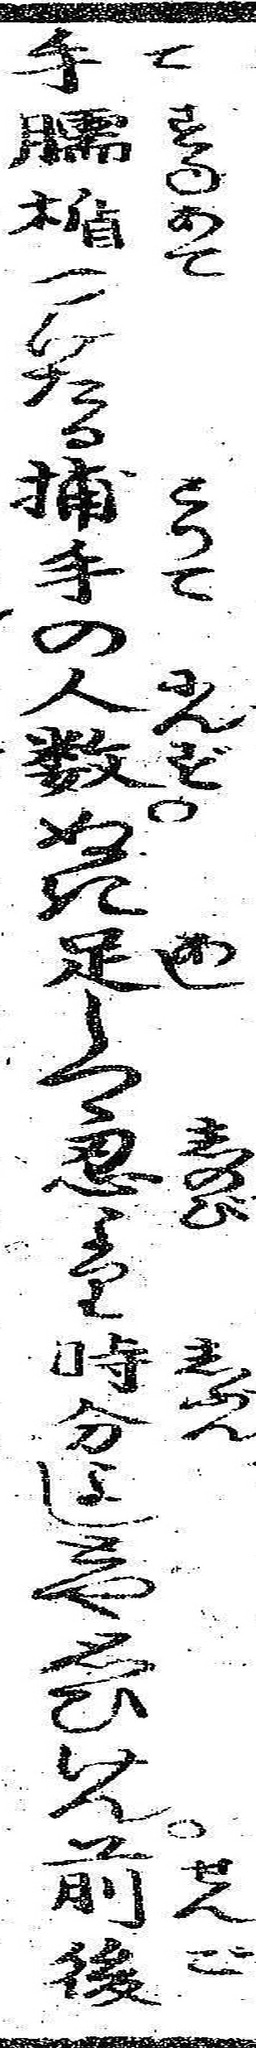手臑楯つけたる捕手の人数。ぬき足しつゝ忍より時分よしとや思ひけん。前後
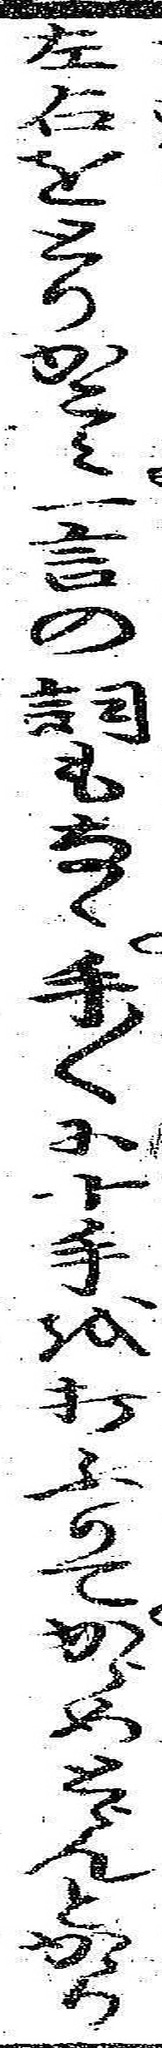左右をとりかこみ。一言の詞もなく。手〳〵に十手を打ふりて。からめとらんとかゝり
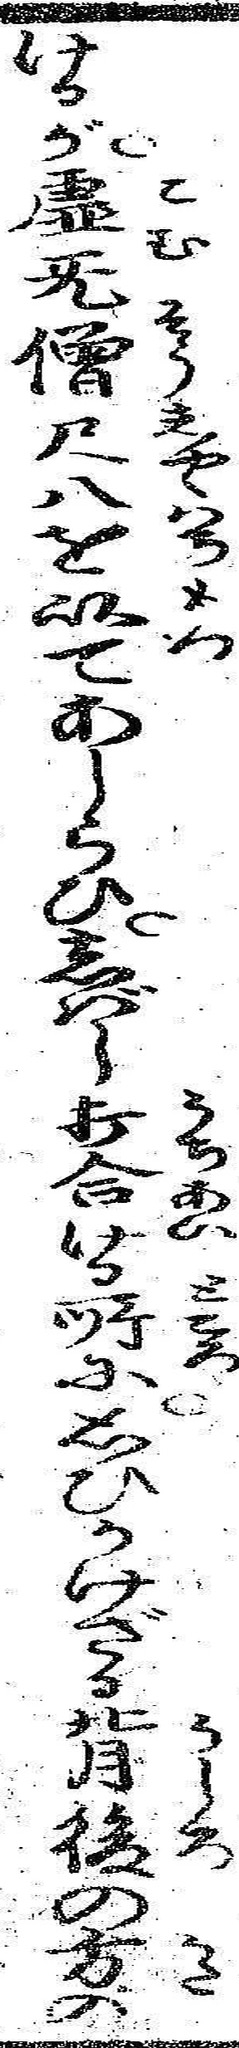けるが。虚無僧尺八を以てあしらひ。しばし打合ける所に。思ひかけざる背後の方の
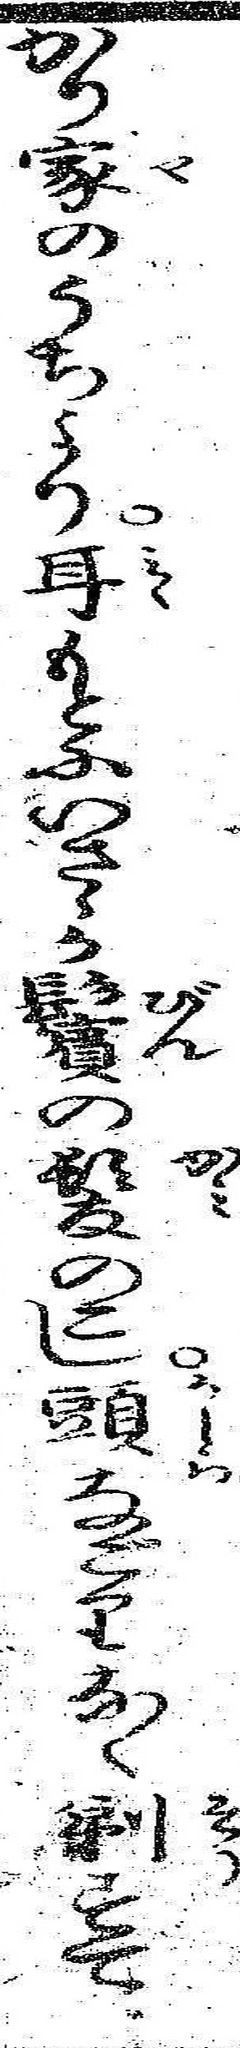かり家のうちより。耳もとにいさゝか鬢の髪のこし。頭なごりなく剃すてゝ
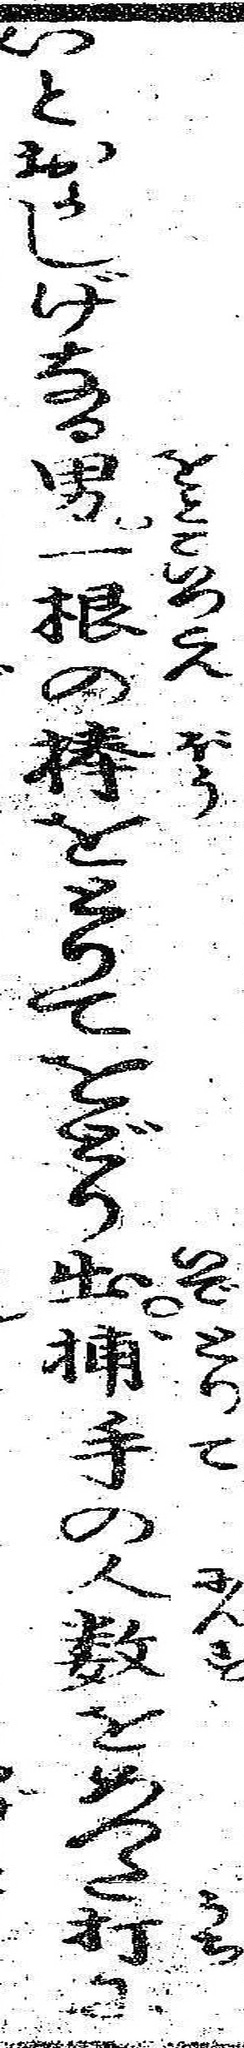いとおかしげなる男。一根の棒をとりてをどり出。捕手の人数をめつた打に
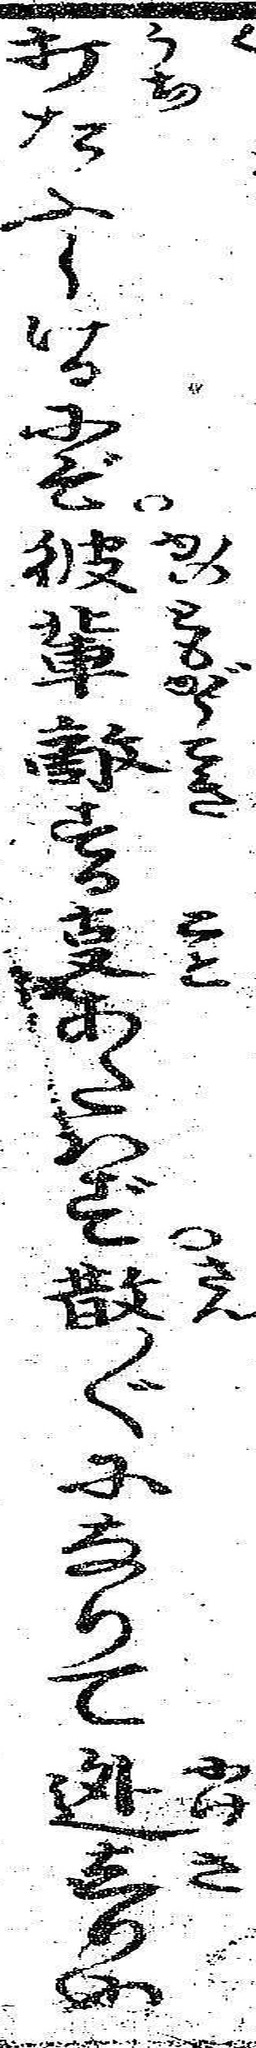打たふしけるにぞ。彼輩敵する事あたはず。散〴〵になりて逃去りぬ

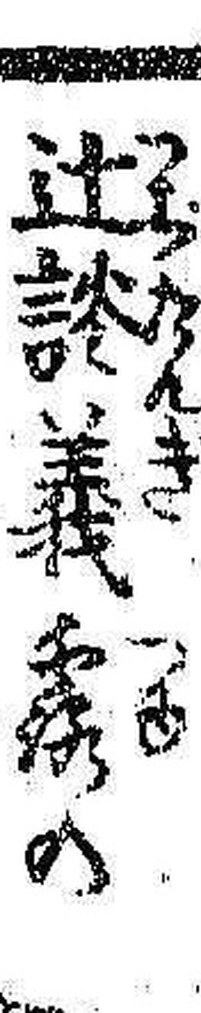辻談義露の
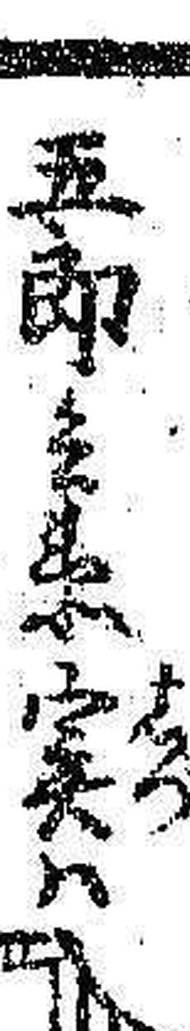五郎兵衛実は
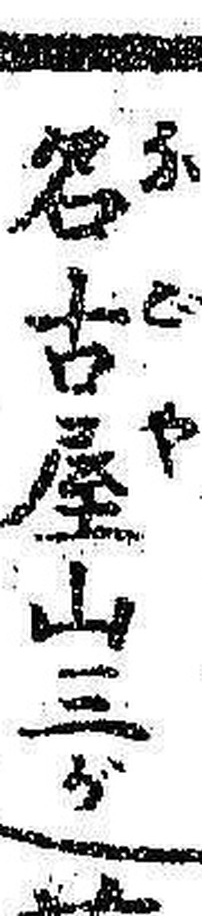名古屋山三が
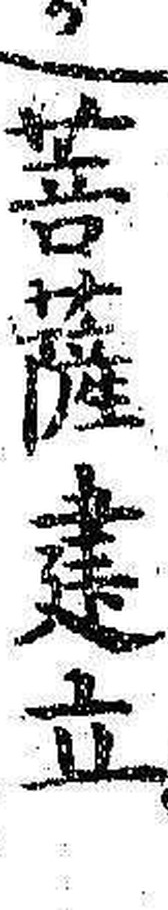菩薩建立
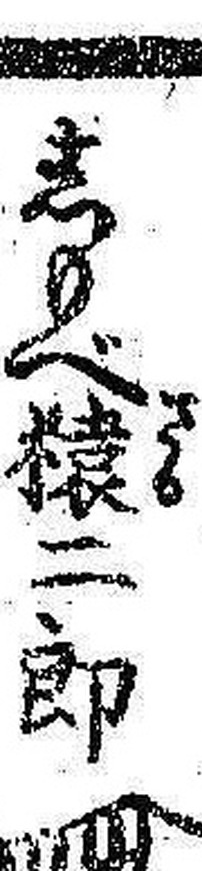しもべ猿二郎
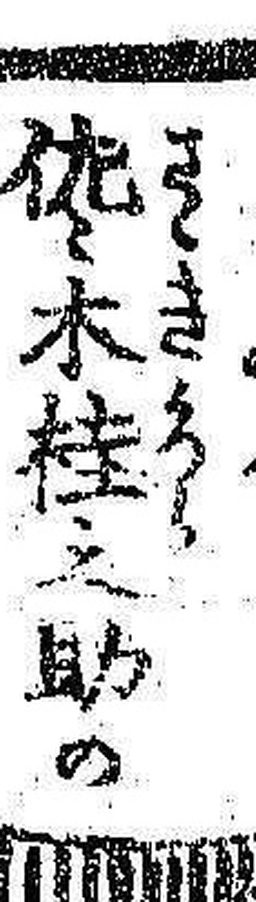佐々木桂之助の
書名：昔話稲妻表紙
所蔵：国文学研究資料館
